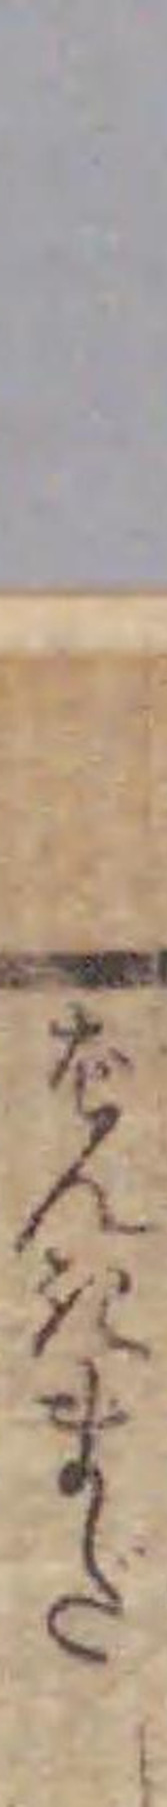ばん記まだ
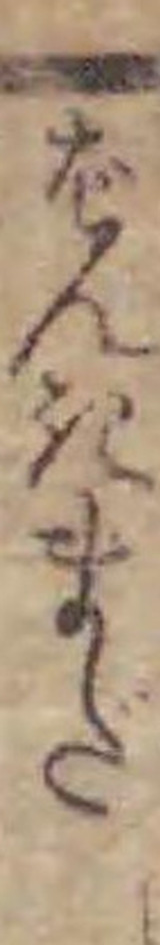ばん記まだ
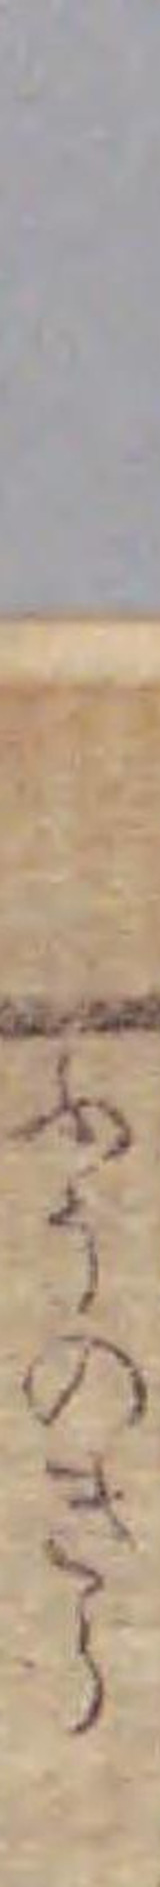ふうのきら
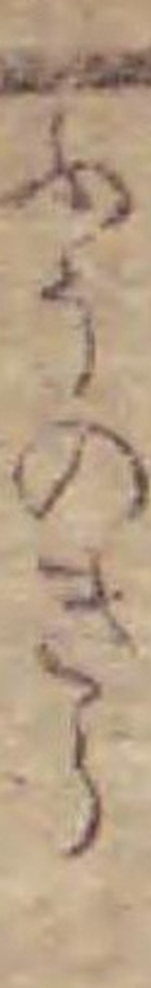ふうのきら
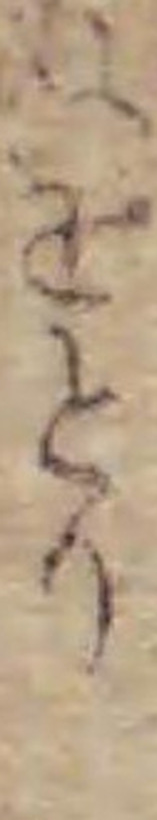ぬをとり
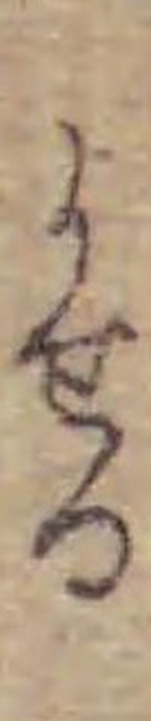よせる
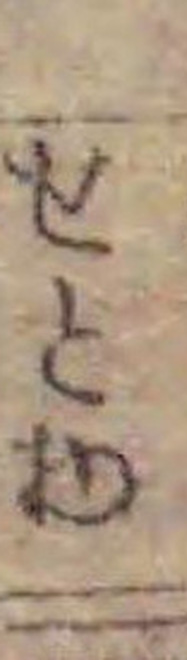せと物
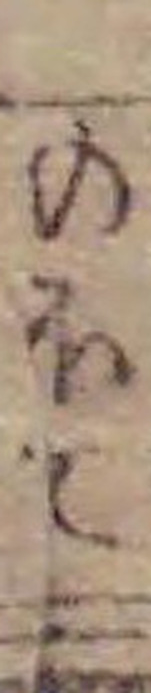のほて
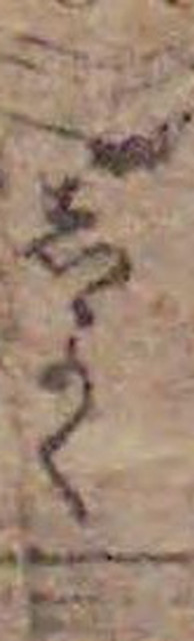しよく
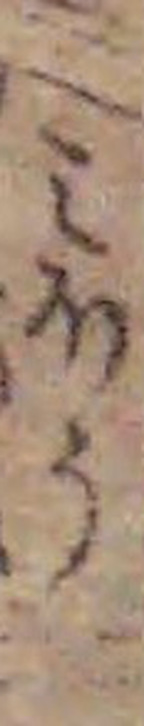みほう

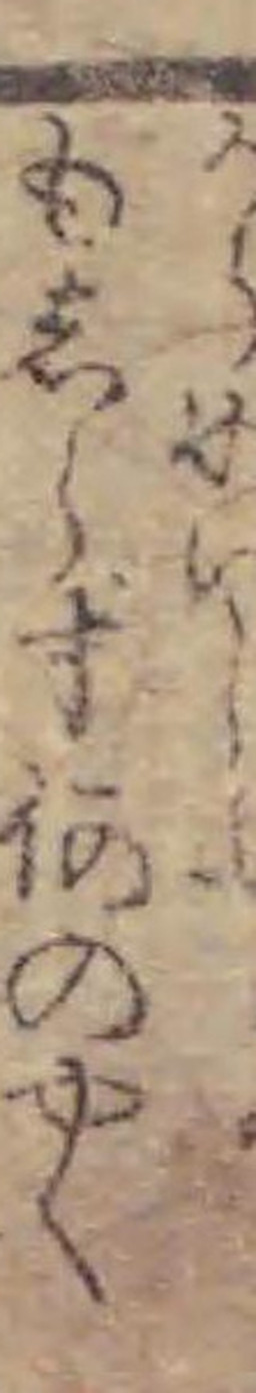もしらず何のやく
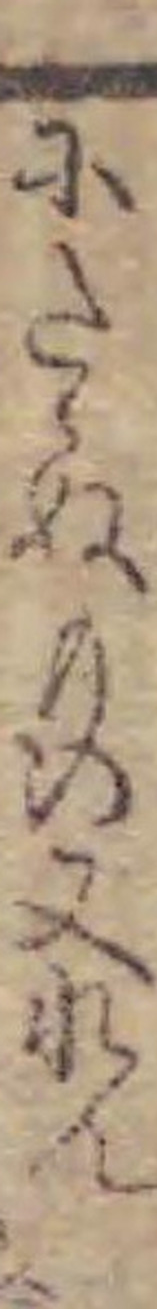にたゝぬもの又れん
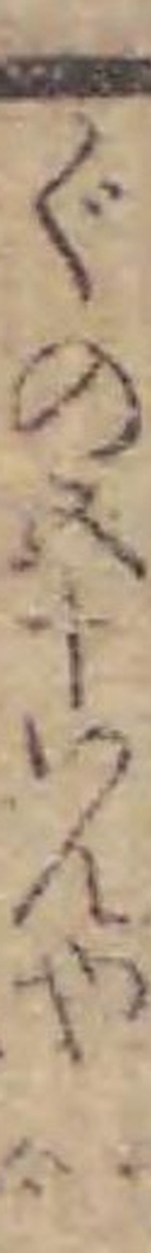ぐの五十いんや
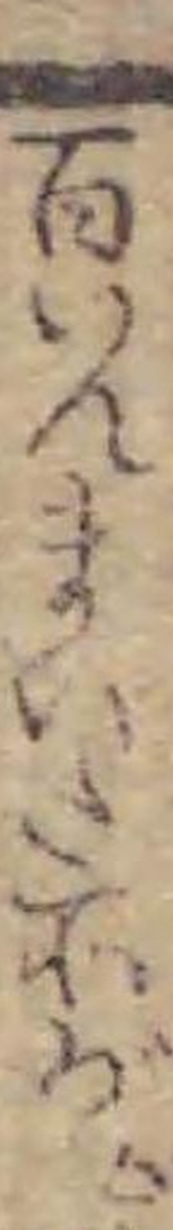百いんまいた所が
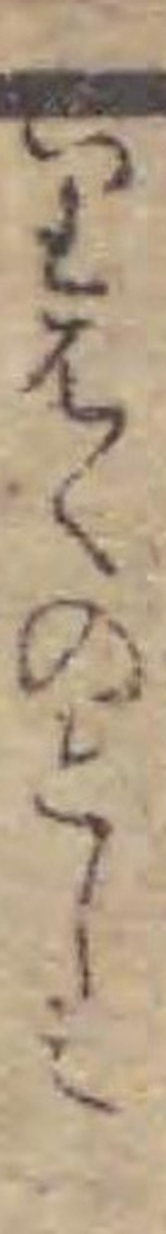りはくのこしみ
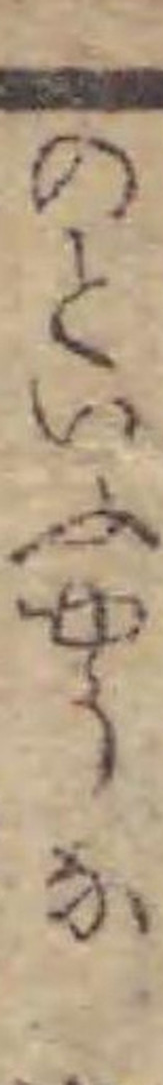のといふやうな
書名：此奴和日本 : 2巻
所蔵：国立国会図書館 National Diet Library, JAPAN
